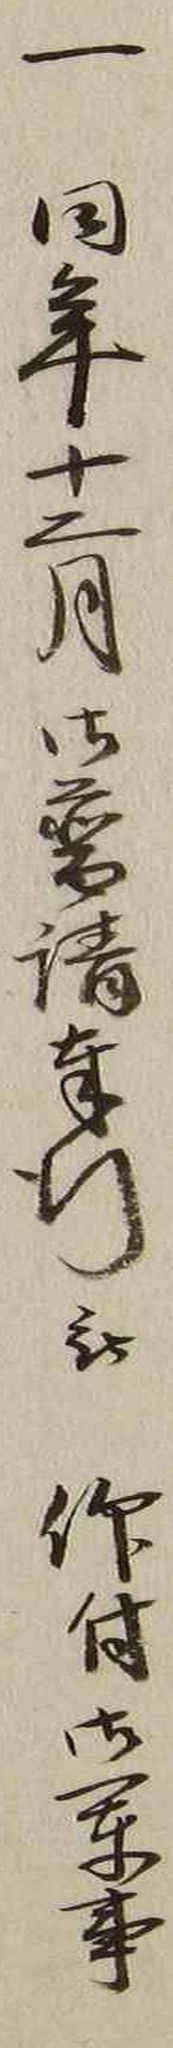一同年十二月御普請奉行被仰付御軍事
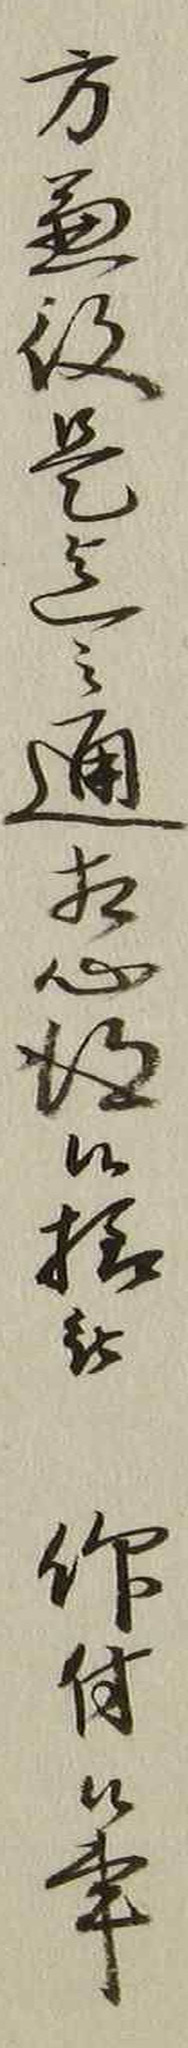方兼役是迄之通相心得候様被仰付候事
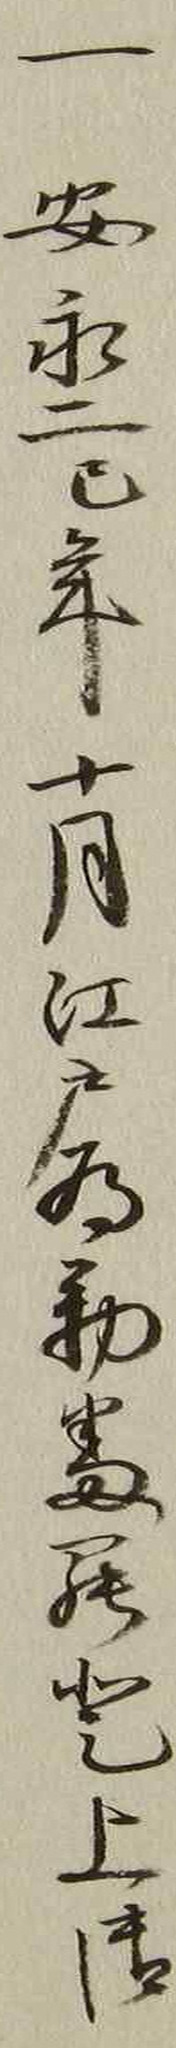一安永二巳年十月江戸為勤番罷登上御
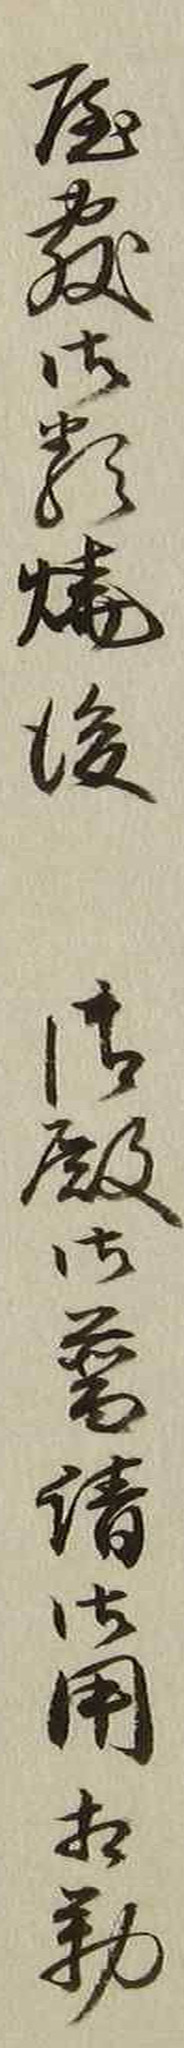屋敷御類焼後御殿御普請御用相勤
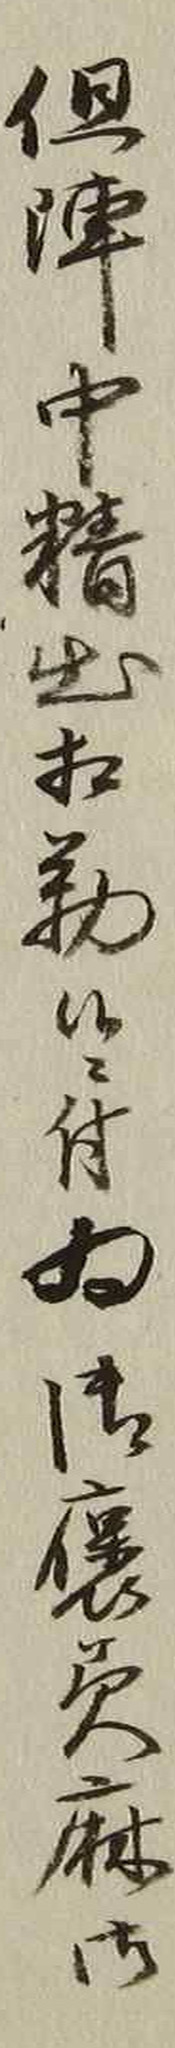但陣中精出相勤候ニ付為御褒美麻御
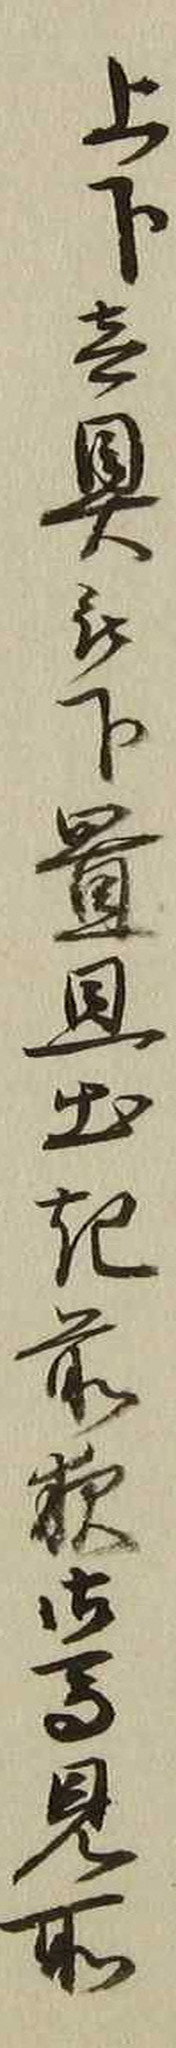上下壱具被下置且出起前夜御馬見所
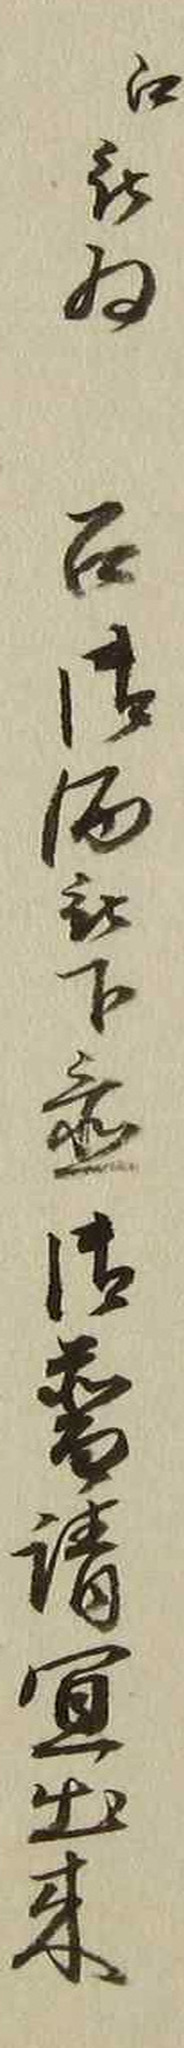江被為召御酒被下置御普請宜出来
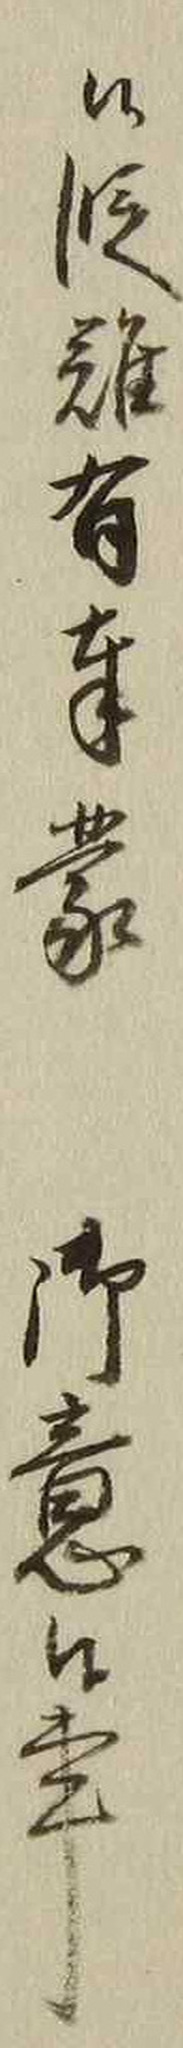候段難有奉蒙御意候事
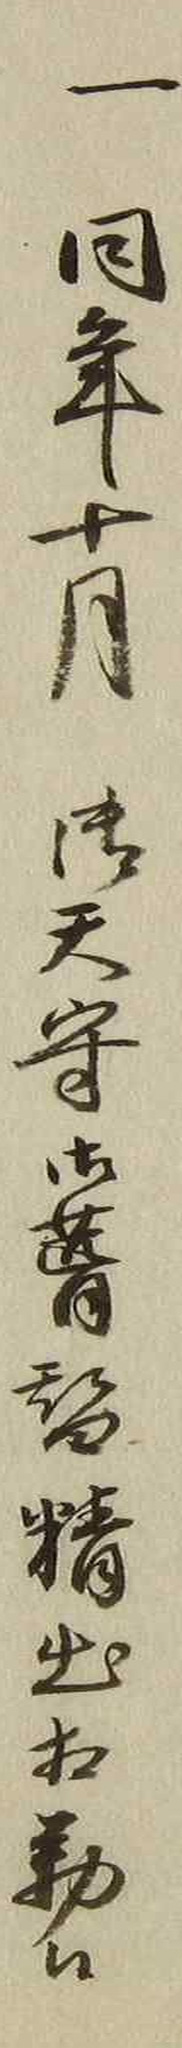一同年十月御天守御葺替精出相勤候
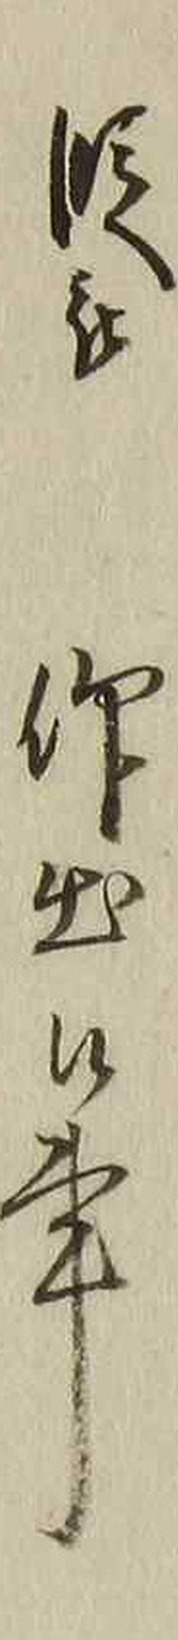段被仰出候事
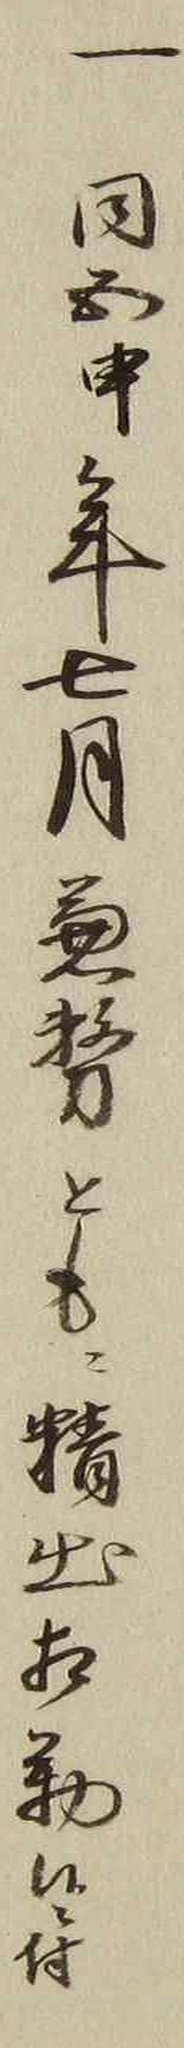一同五申年七月兼務ともニ精出相勤候ニ付
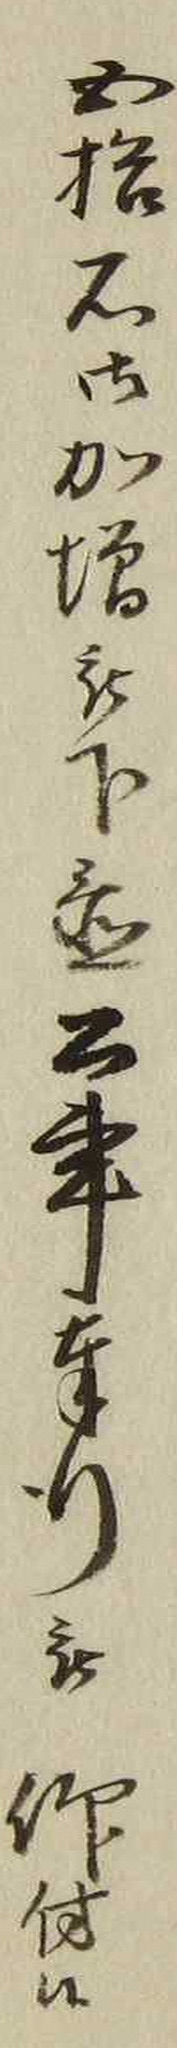五拾石御加増被下置公事奉行被仰付候
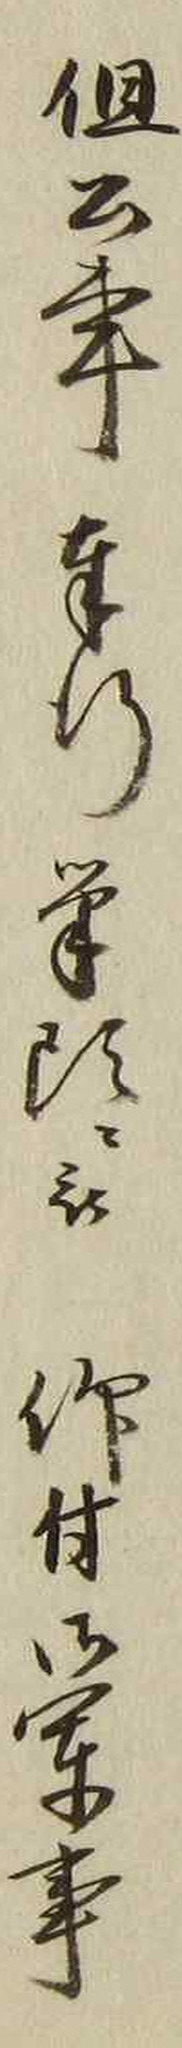但公事奉行筆頭ニ被仰付御軍事
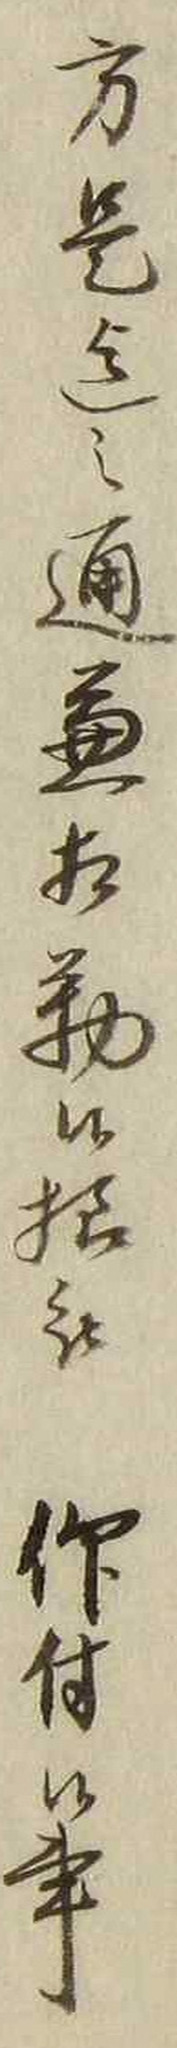方是迄之通兼相勤候様被仰付候事
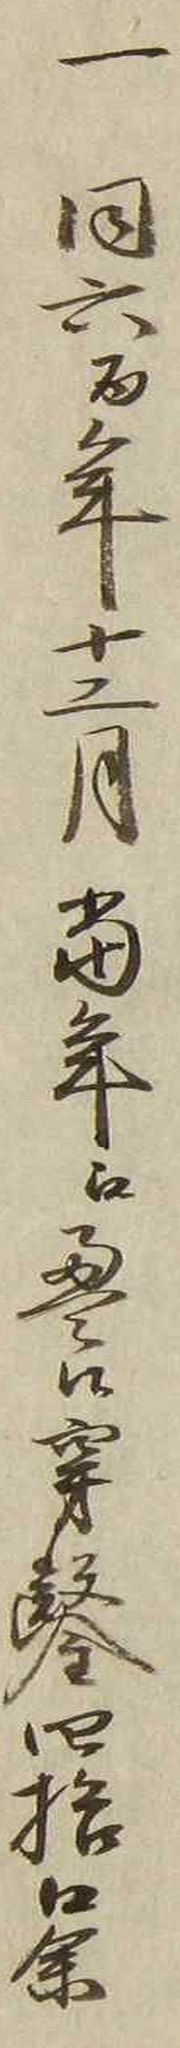一同六酉年十二月当年江畳候穿鑿四拾口余

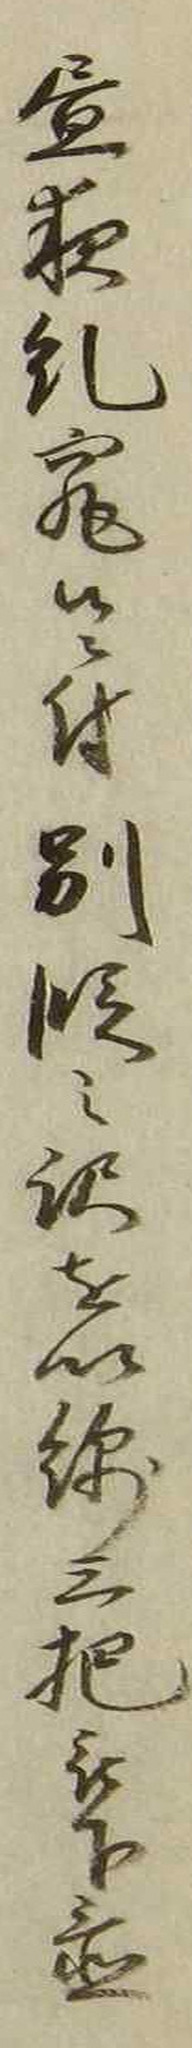昼夜糺究候ニ付別段之訳を以綿三把被下置
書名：諸士系譜　巻之128　た之部4
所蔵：会津若松市立会津図書館
